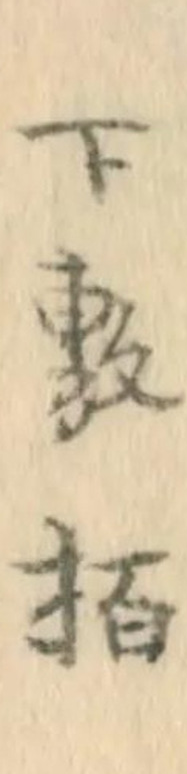下敷柏
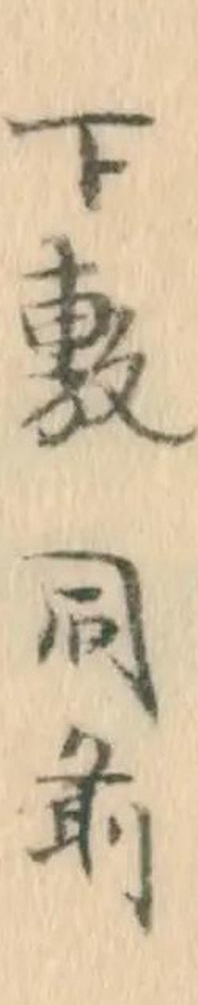下敷同前

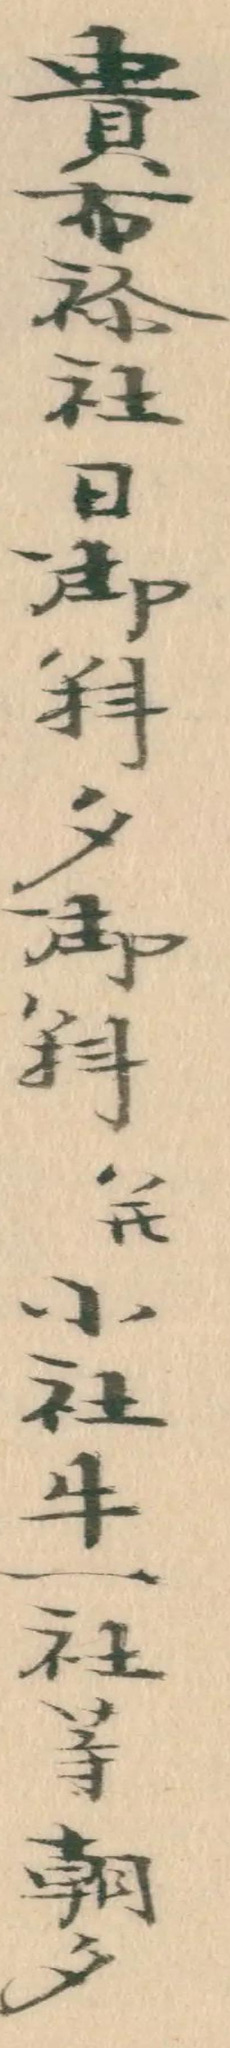貴布禰社日御料夕御料并小社牛一社等朝夕
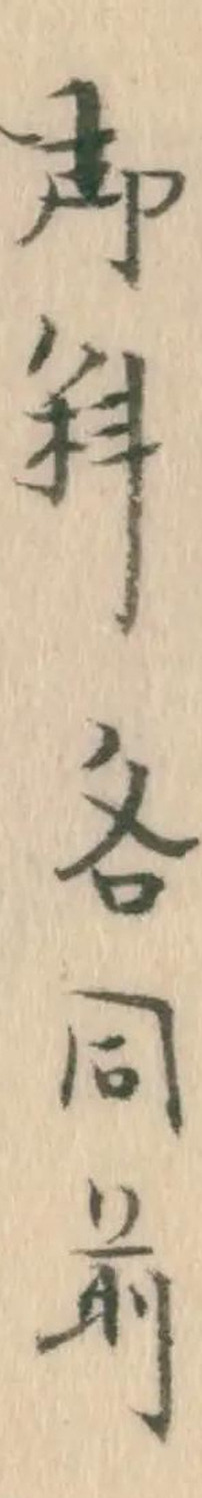御料各同前
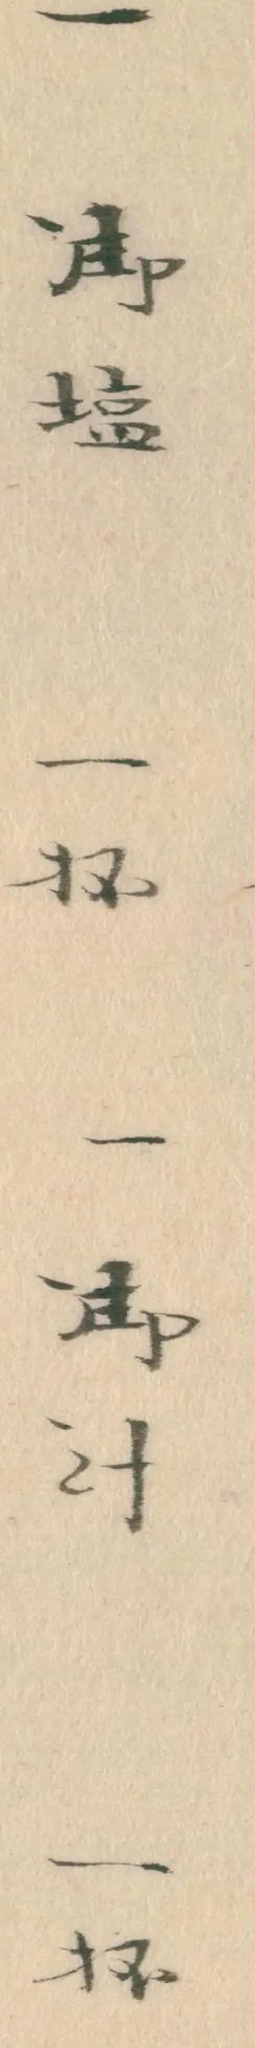一御塩一抔一御汁一抔
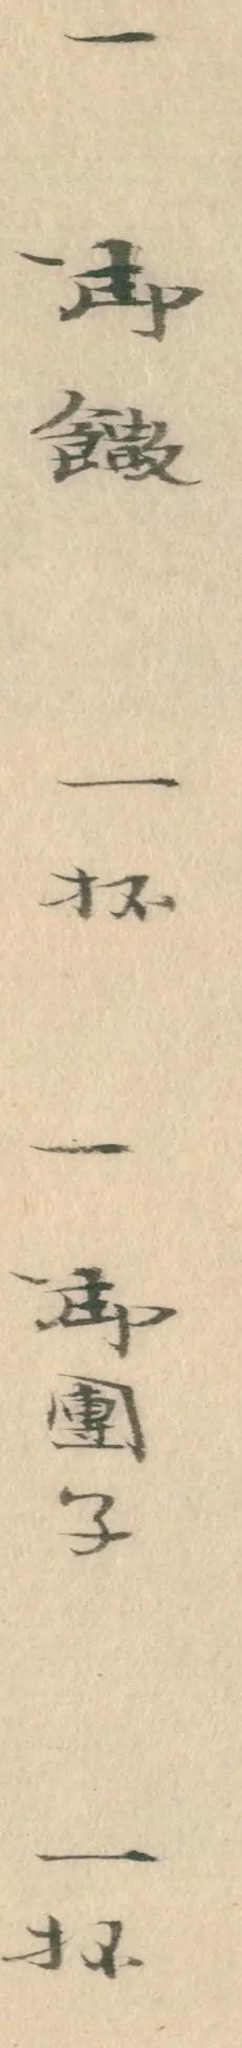一御饊一抔一御団子一抔

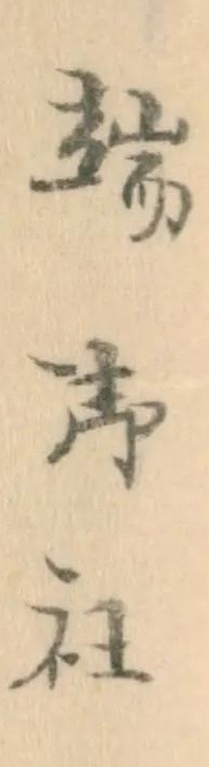端御社
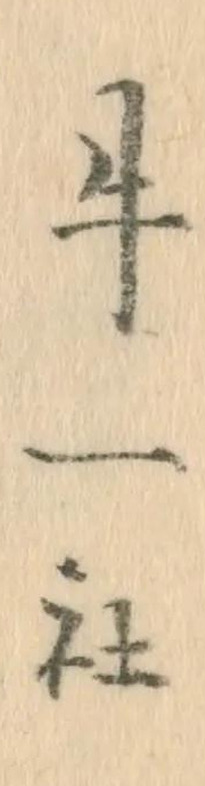牛一社

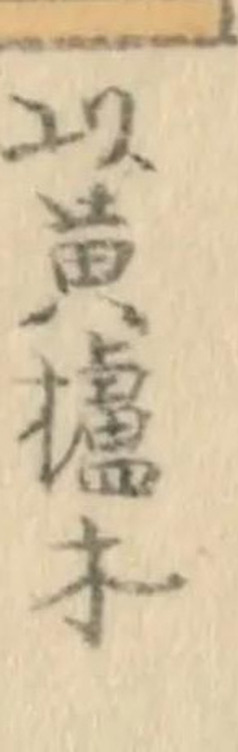以黄櫨木
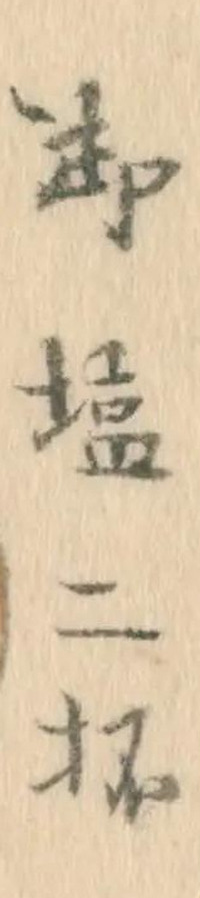御塩二抔
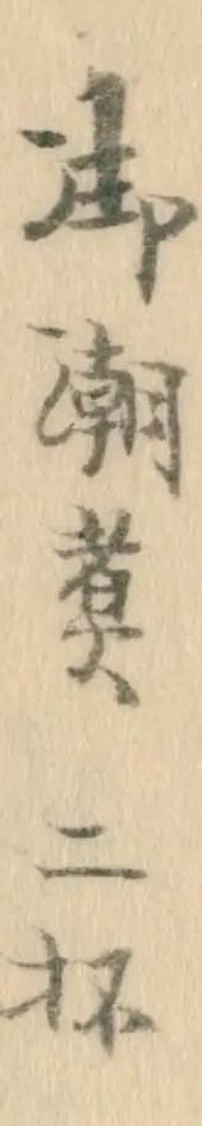御潮煮二抔
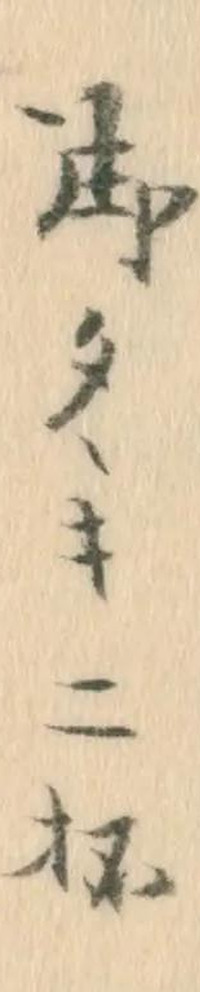御タヽキ二抔

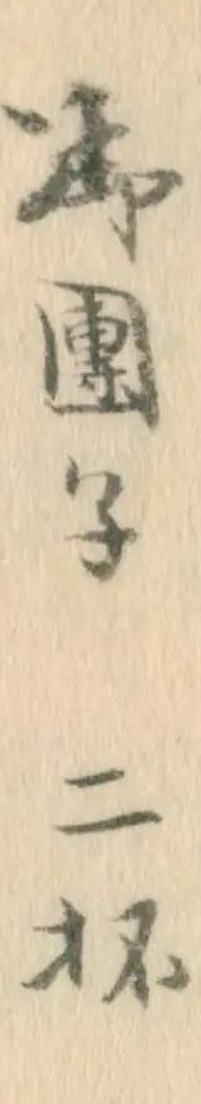御団子二抔
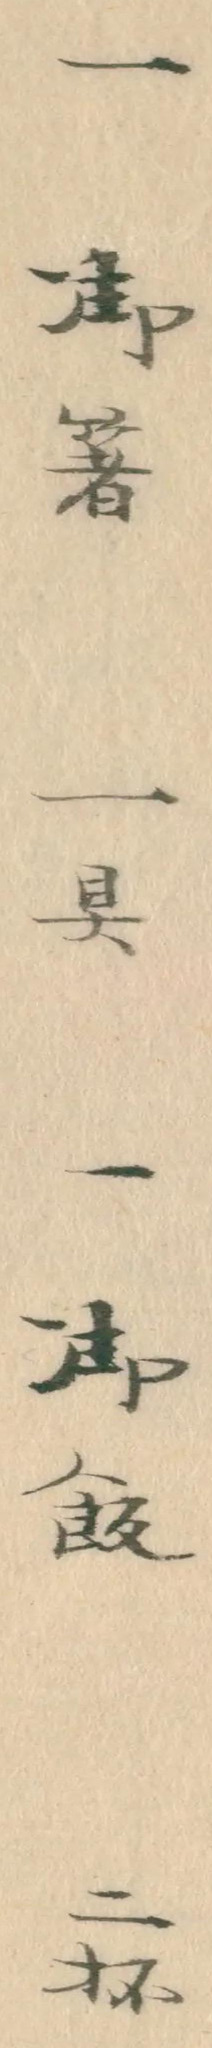一御箸一具一御飯二抔
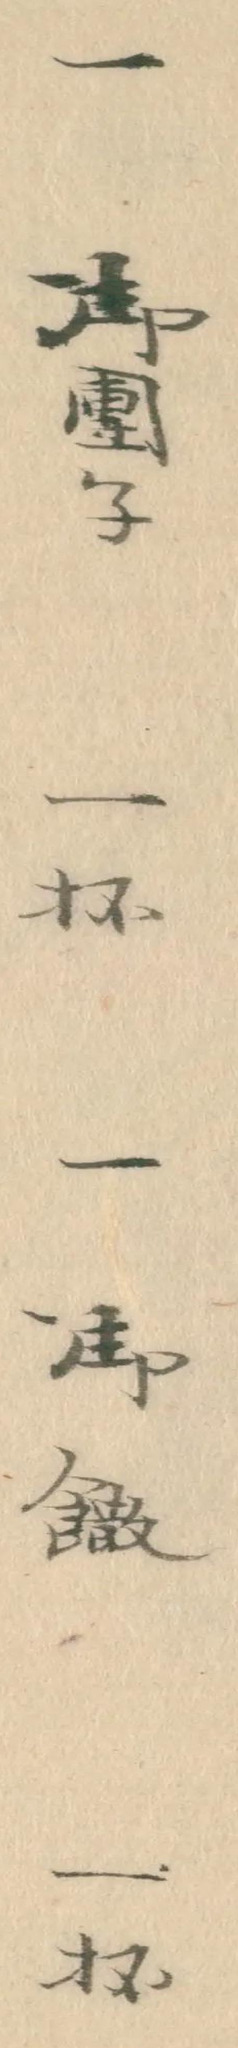一御団子一抔一御饊一抔
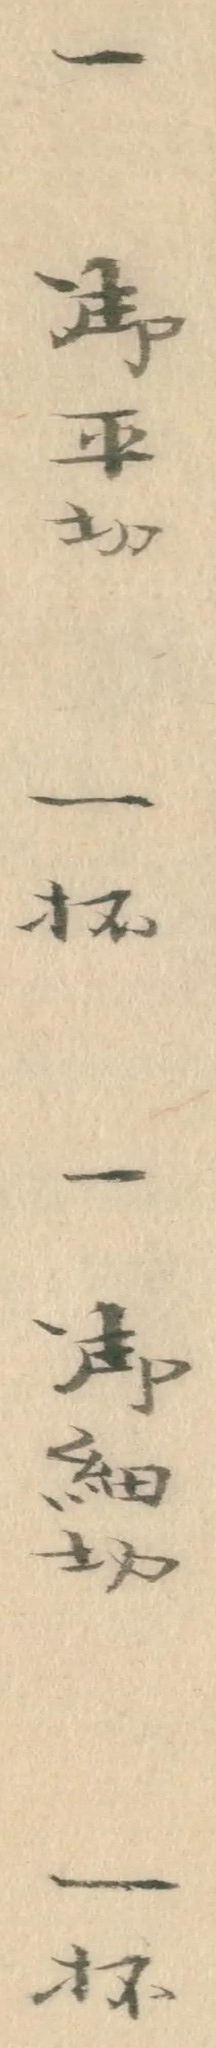一御平切一抔一御細切一抔
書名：葵御祭供進之神饌諸品色目書
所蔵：国立国会図書館 National Diet Library, JAPAN
